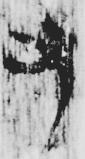又（有）
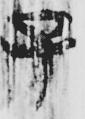子
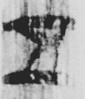五
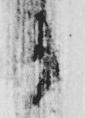人
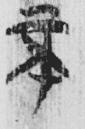不
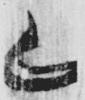㠯（以）
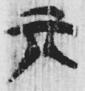亓（其）
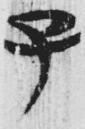子
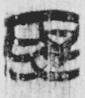爲
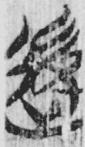後
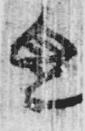見
